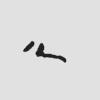乍
